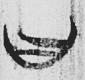曰
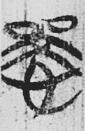○（鄰）
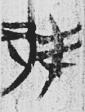邦
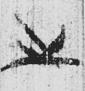之
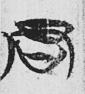君
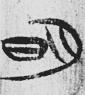明
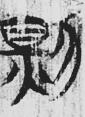則
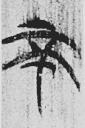不
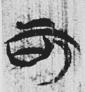可
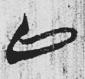㠯
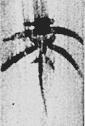不
